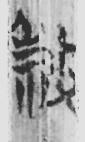殺
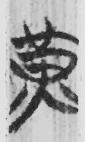黃
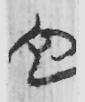它
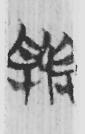與
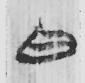白
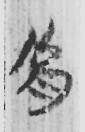兔
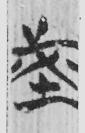{必土}
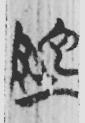地（地）
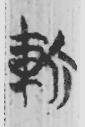斬
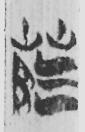{艹阝仌}（陵）
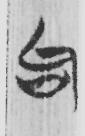句
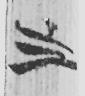之
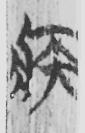疾
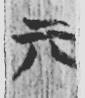亓
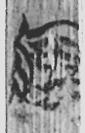瘳
